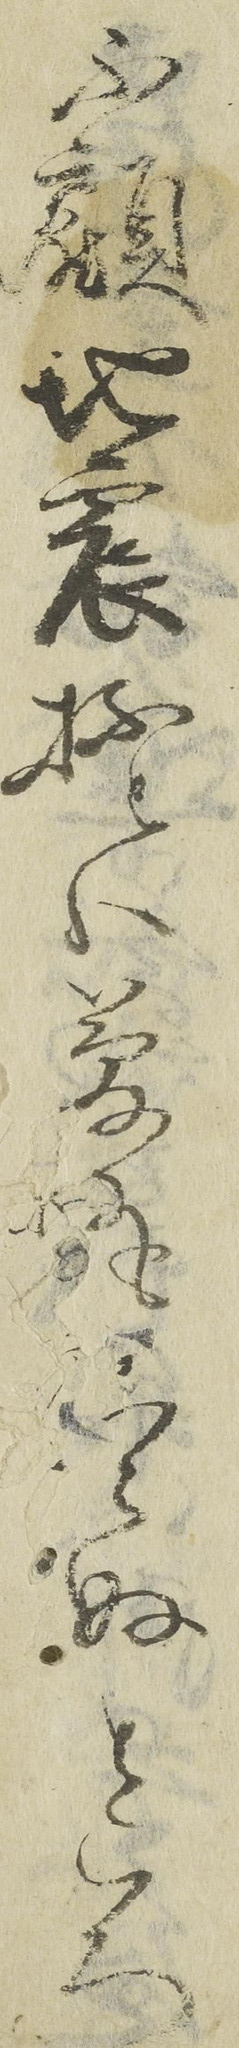不顧地震杯とハ夢にもしらぬところ
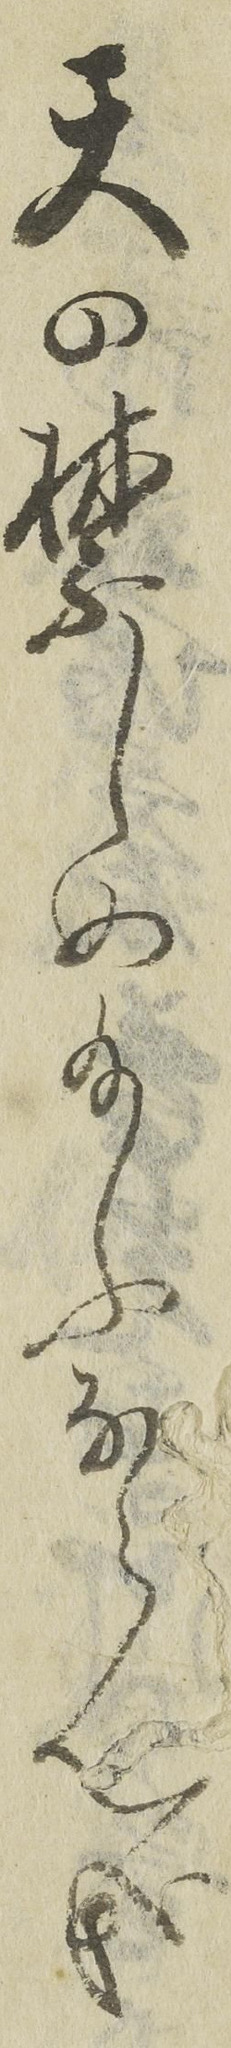天の禁しめ給ふならん哉
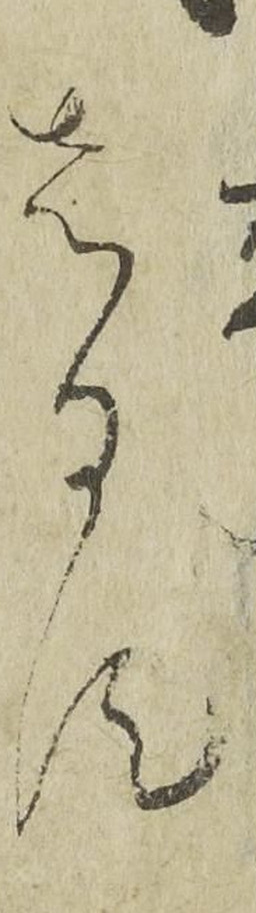しるす

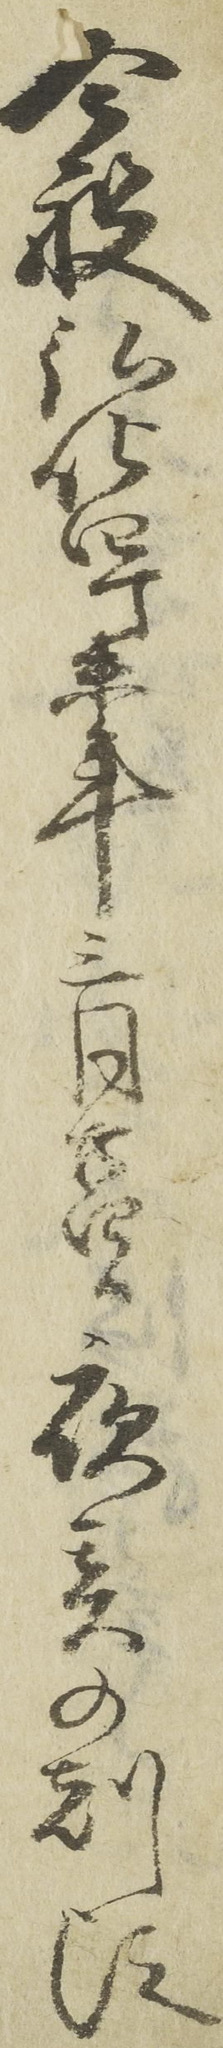今般弘化四丁未年三月廿四日夜亥の刻頃
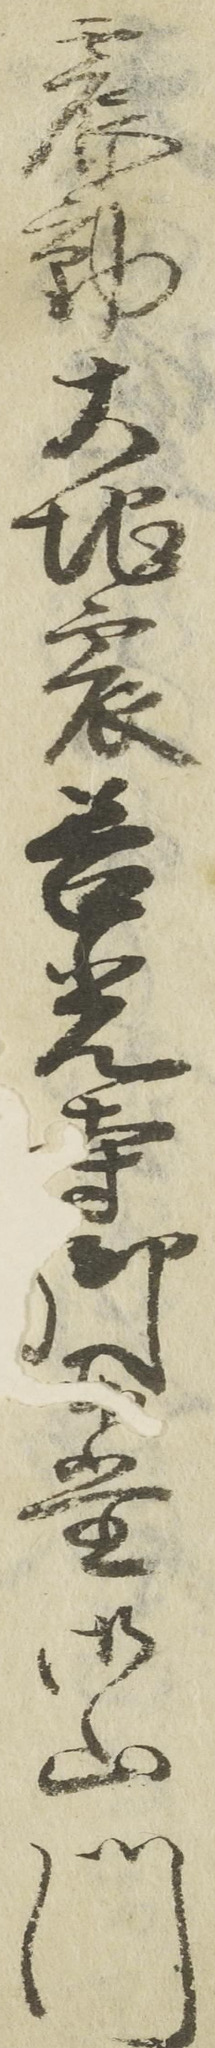震動大地震善光寺御本？堂御山門
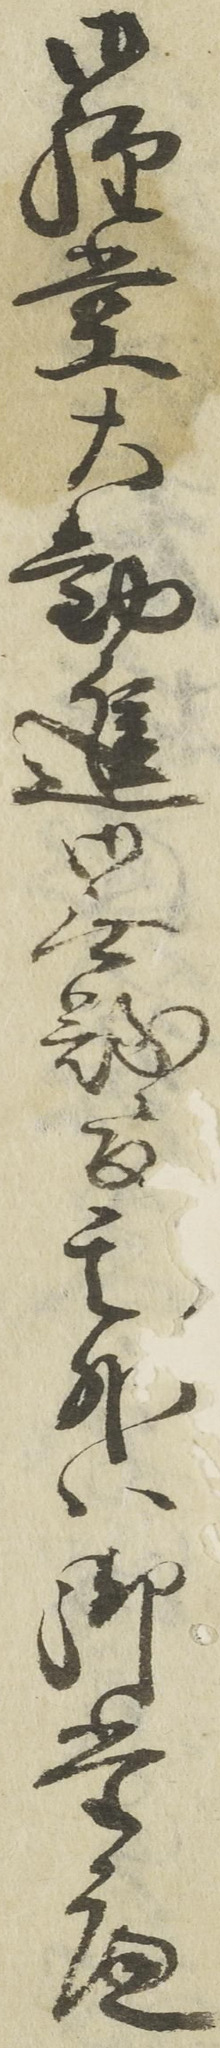御経堂大勧進御無難ニ而其外ハ御堂庭
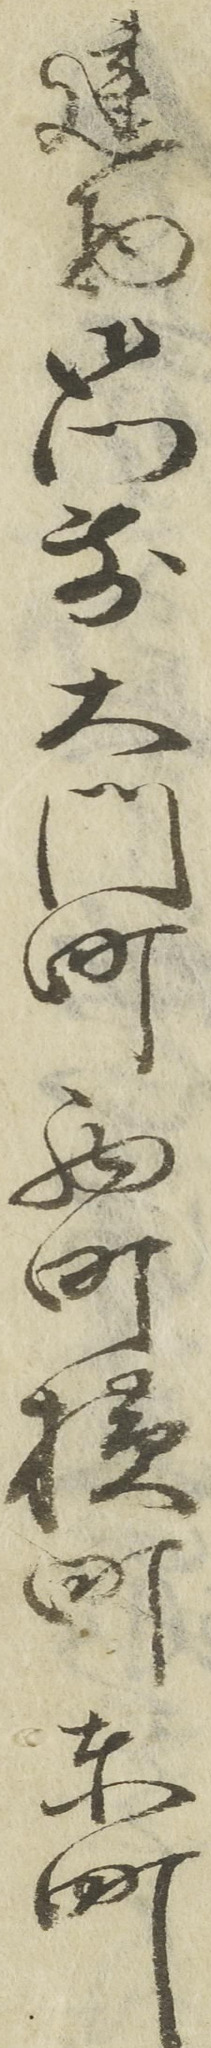建物御門前大門町西町横町東町
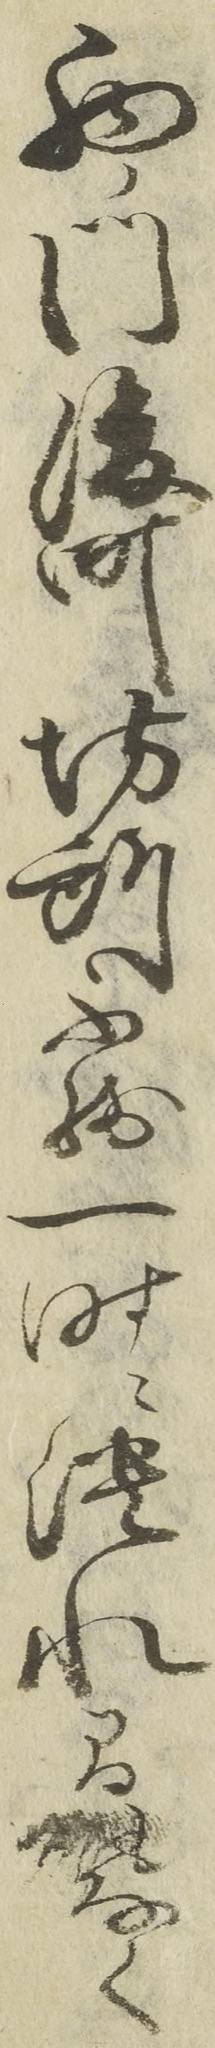西ノ門後町坊所不残一時ニ潰れ間もなく
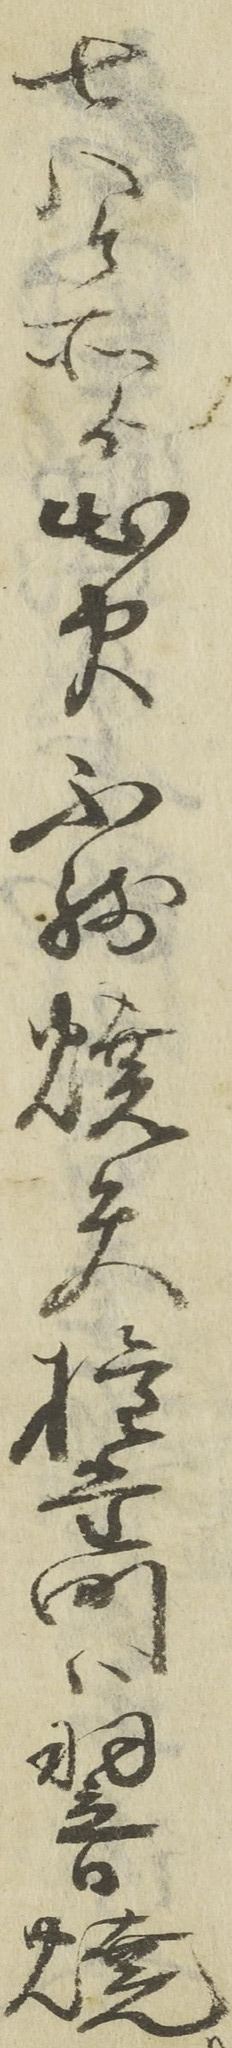七八ヶ所ゟ出火不残焼失権堂町ハ翌日焼ル
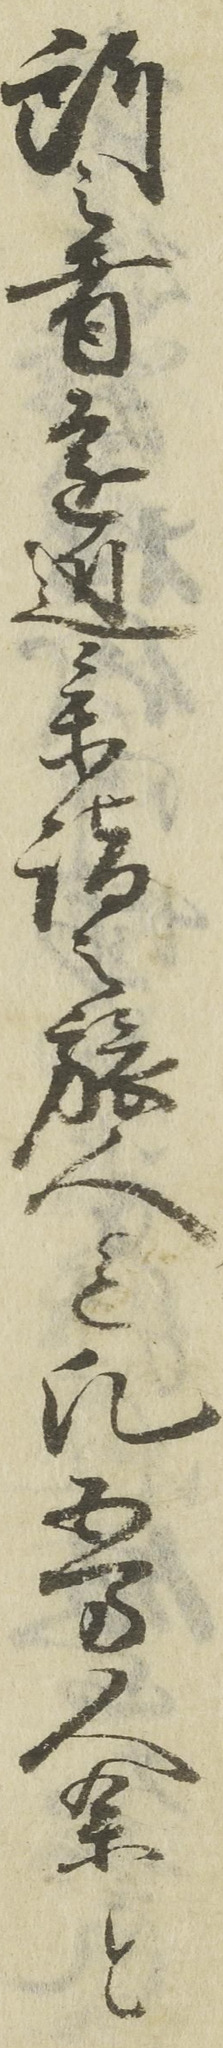所之者遠近参詣之旅人迄凡五万人余と
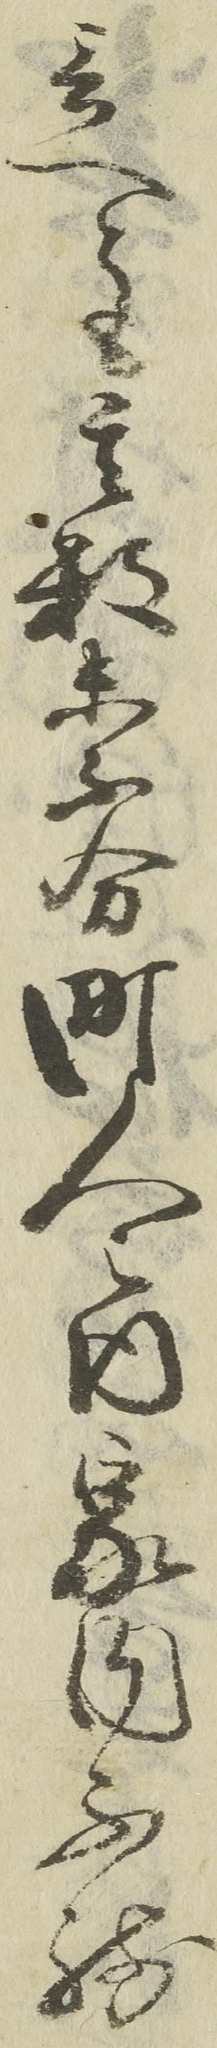言へとも其数未不分町人之内家内不残
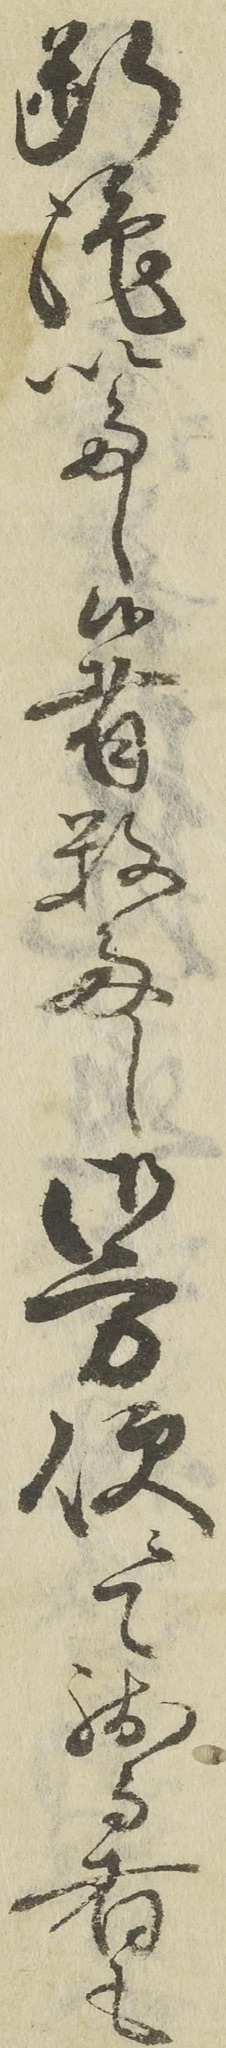断絶いたし候者数多し御方便ニて残る者も
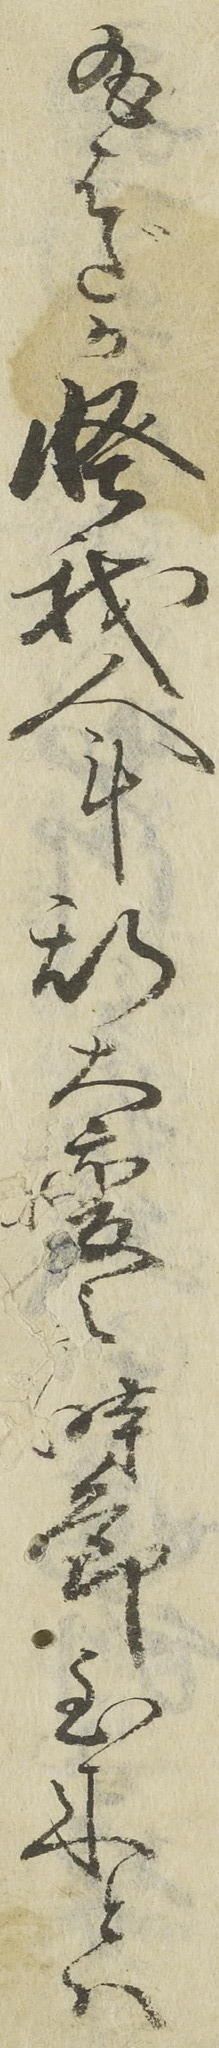丸はだか怪我人斗斯大変之時節至来とハ
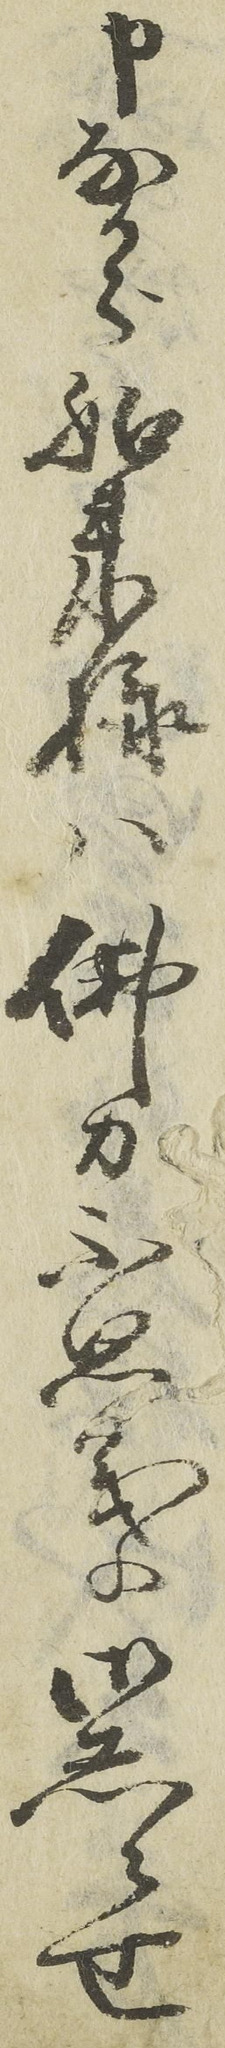申なから如来様ハ佛力不思義の御しらせ

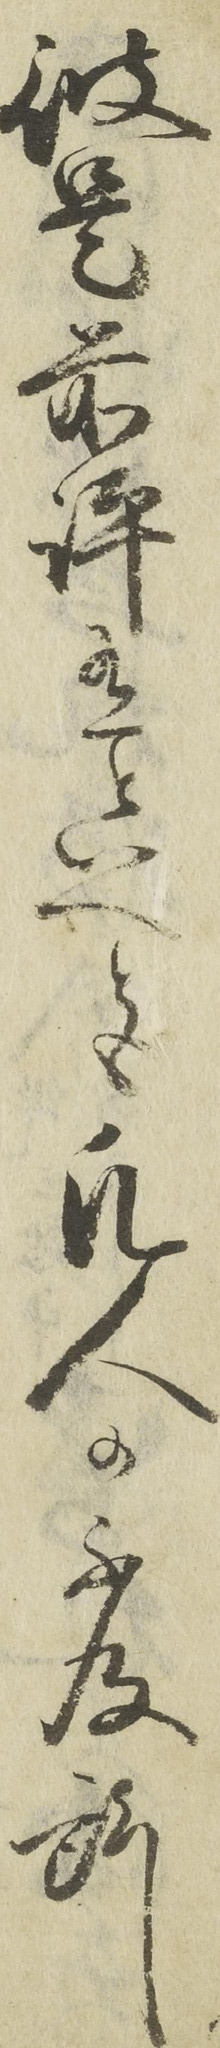彼是前評有といへとも凡人の不及所
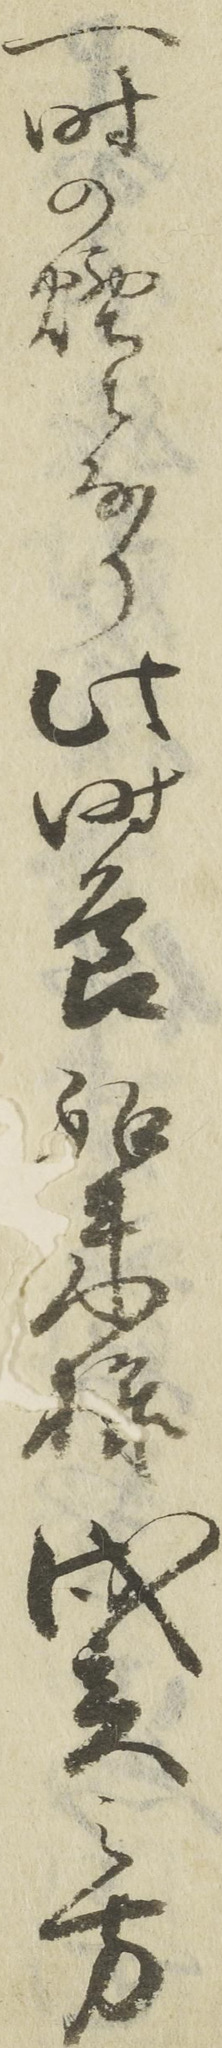一時の煙となり此時節如来様戌亥之方
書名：弘化四　大地震由来　全
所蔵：東京大学地震研究所図書室 Earthquake Research Institute Library, The University of Tokyo, JAPAN
